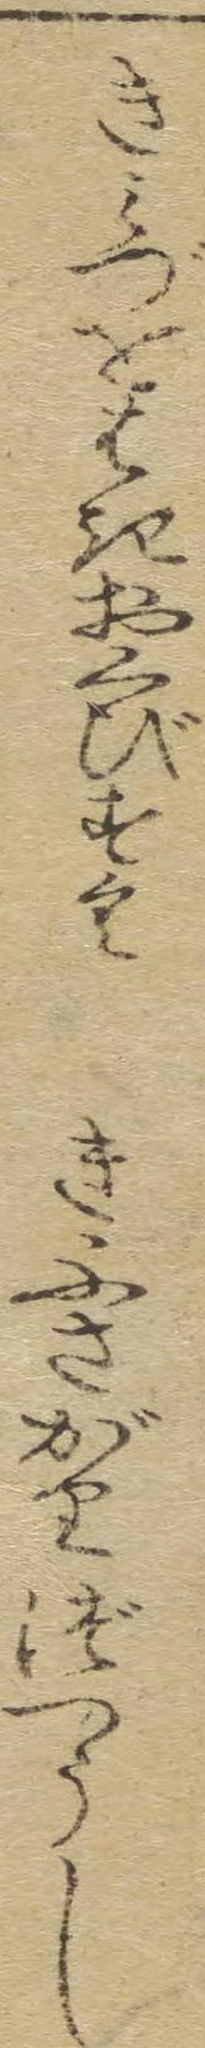きみづをはきおくびすくきふさがりづつうし
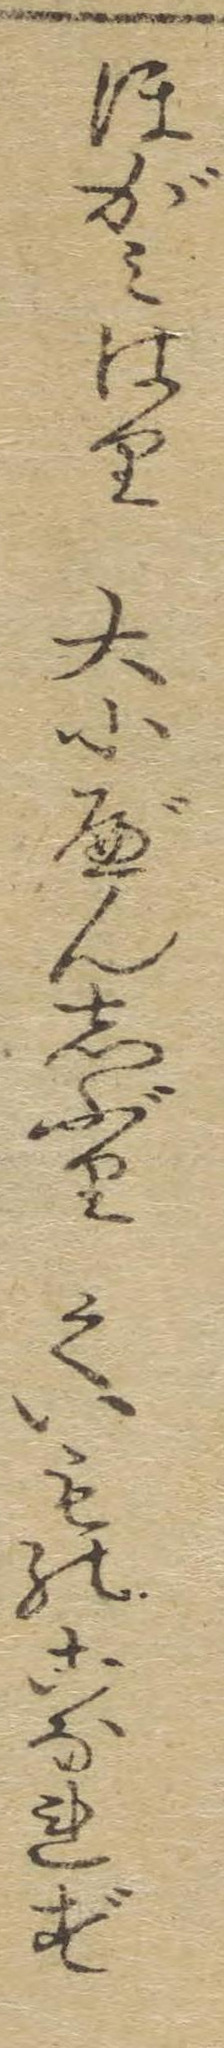ほがみはり大小べんしぶりくいものこなれず
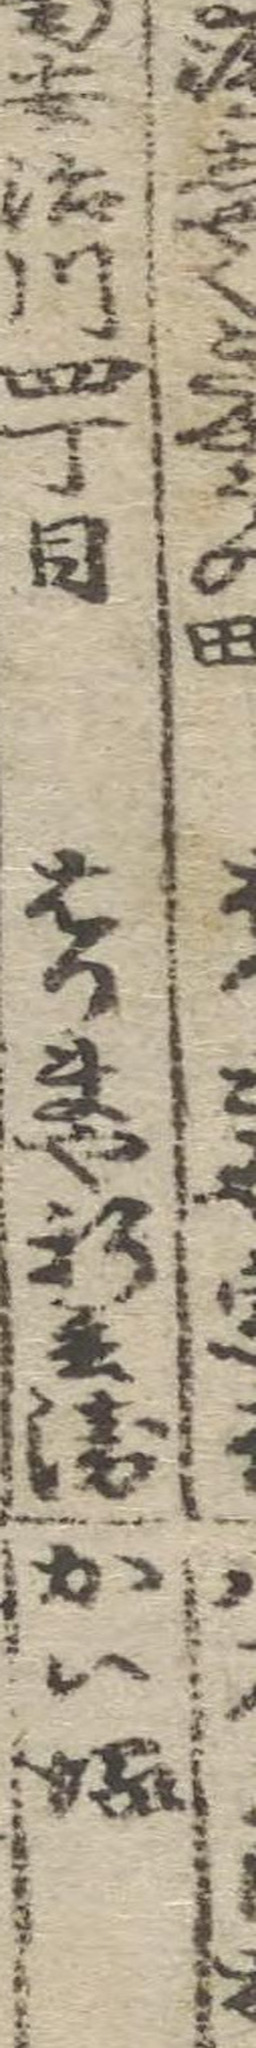南安治川四丁目はりまや新兵衛
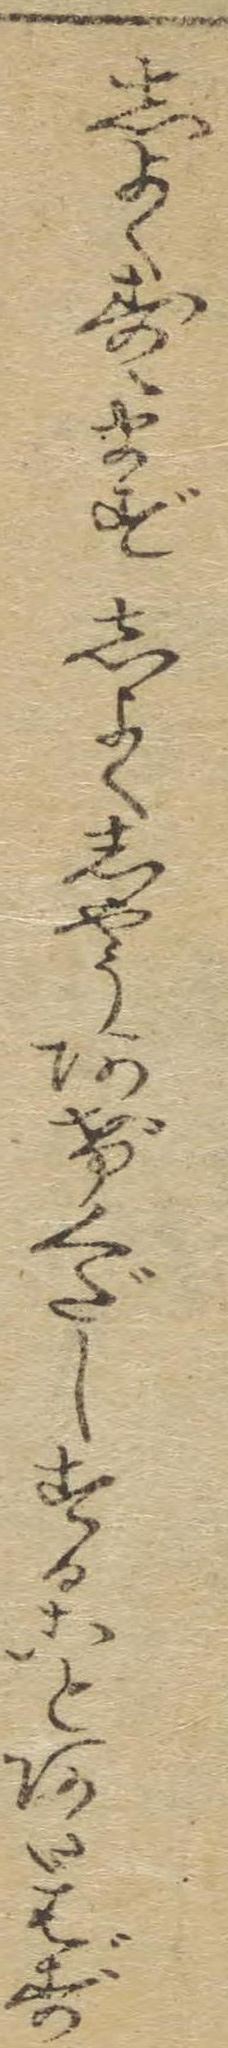しよくすゝまずしよくしやうあげくだしすることあたはず
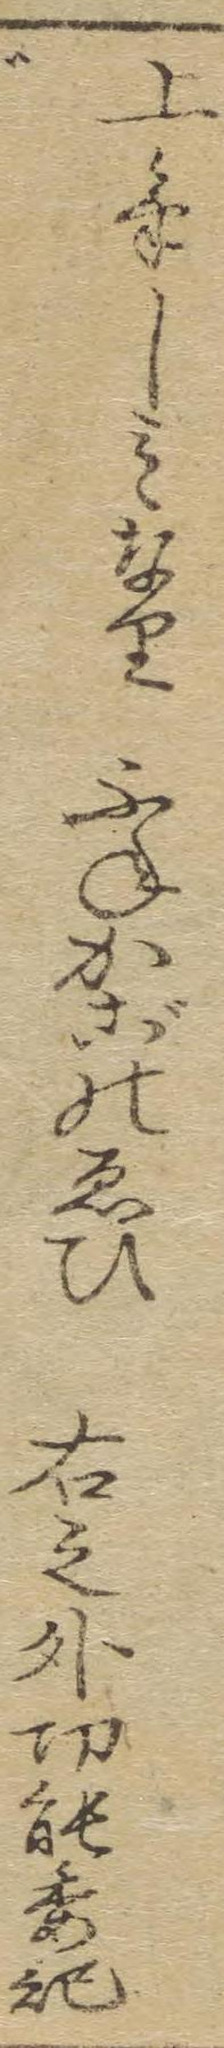上気しみゝなりふねかごのゑひ右之外功能委記
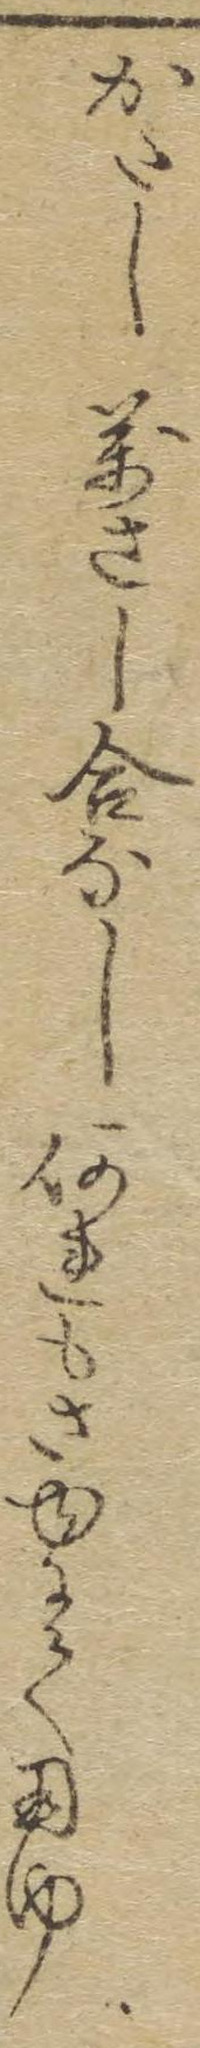がたし万さし合なし何れもさゆにて用ゆ
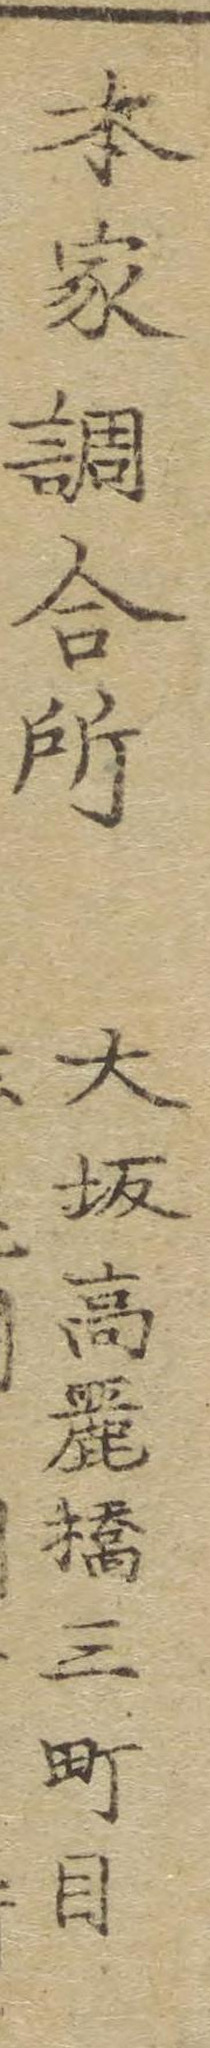本家調合所大坂高麗橋三町目
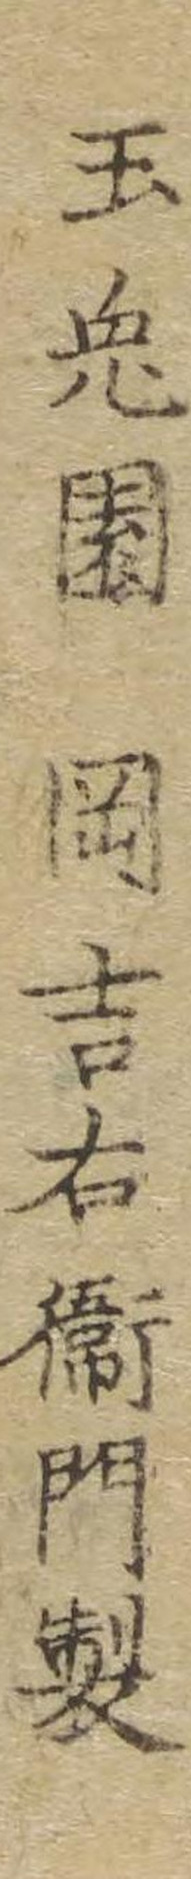玉兎園岡吉右衛門製
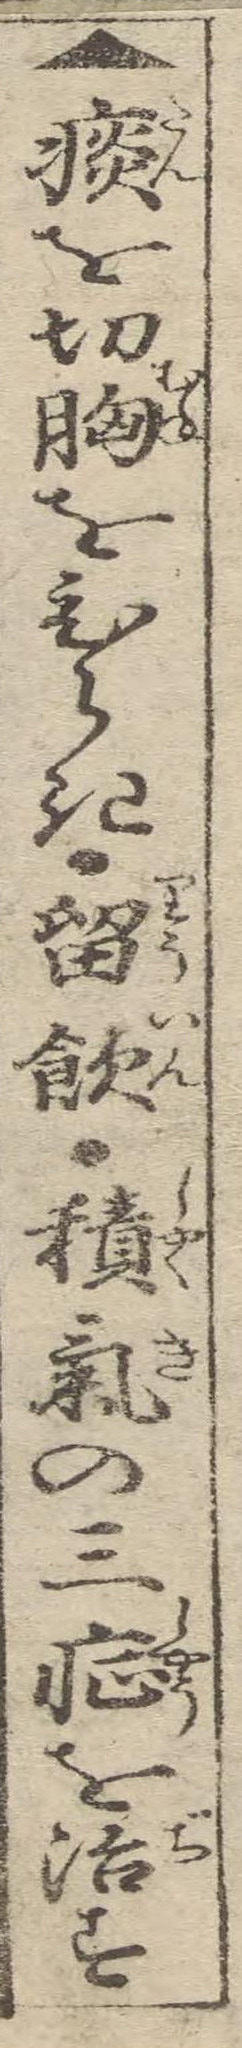痰を切胸をひらき・留飲・積気の三症を治す
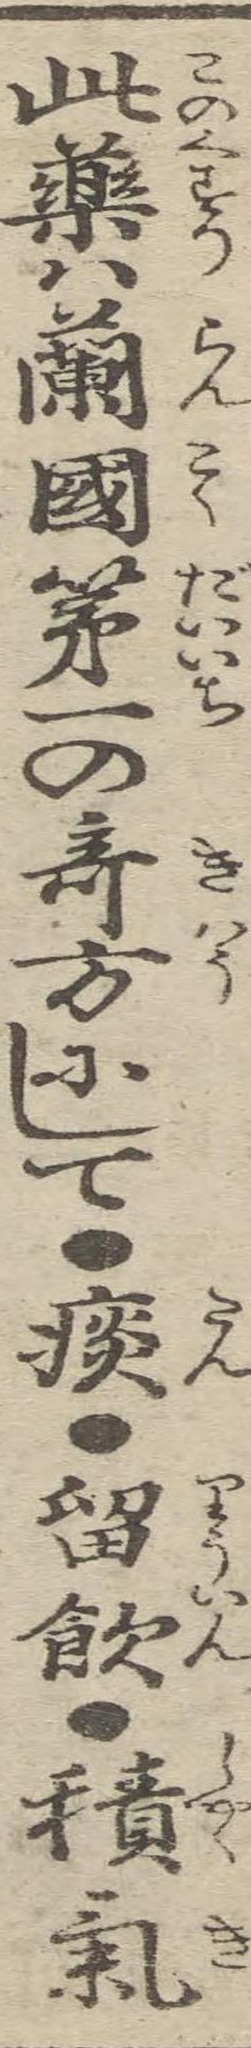此薬は蘭国第一の奇方にして・痰・留飲・積気
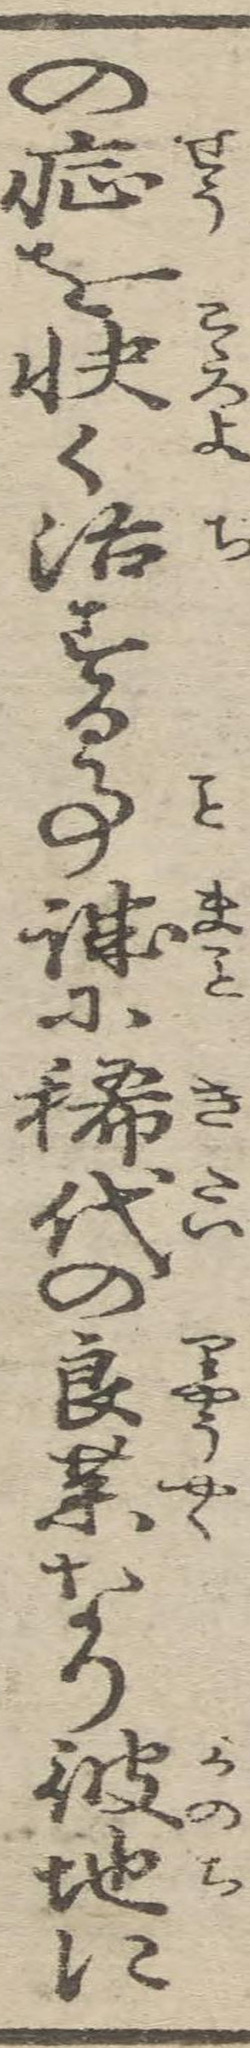の症を快く治する事誠に稀代の良薬なり彼地に
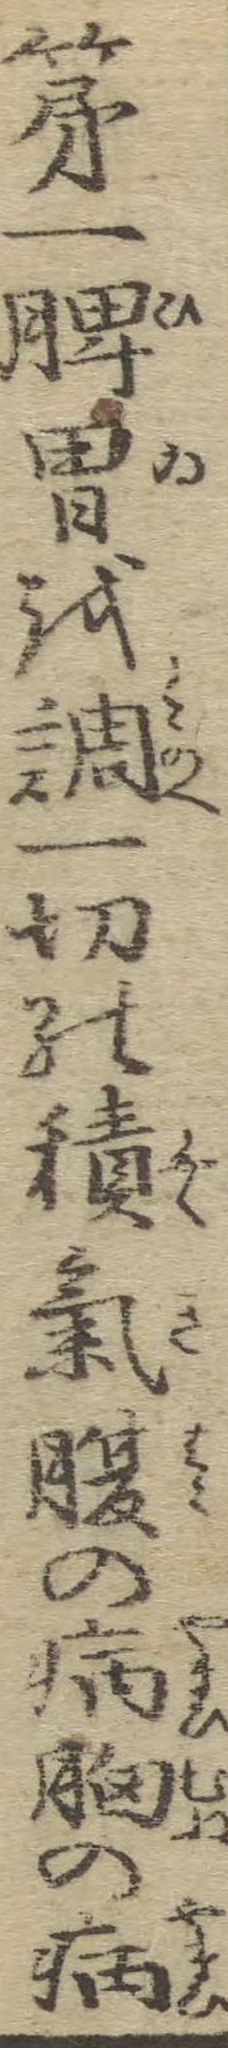第一脾胃を調一切の積気腹の病胸の病
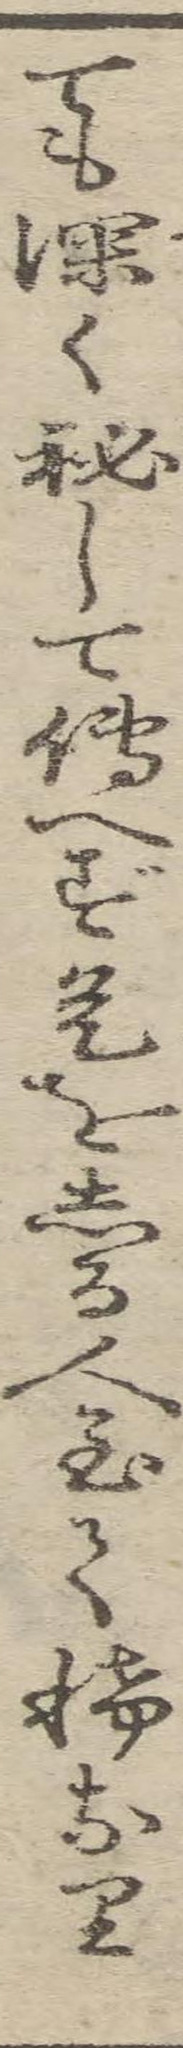ても深く秘して傳へず是をしる人至て稀なり
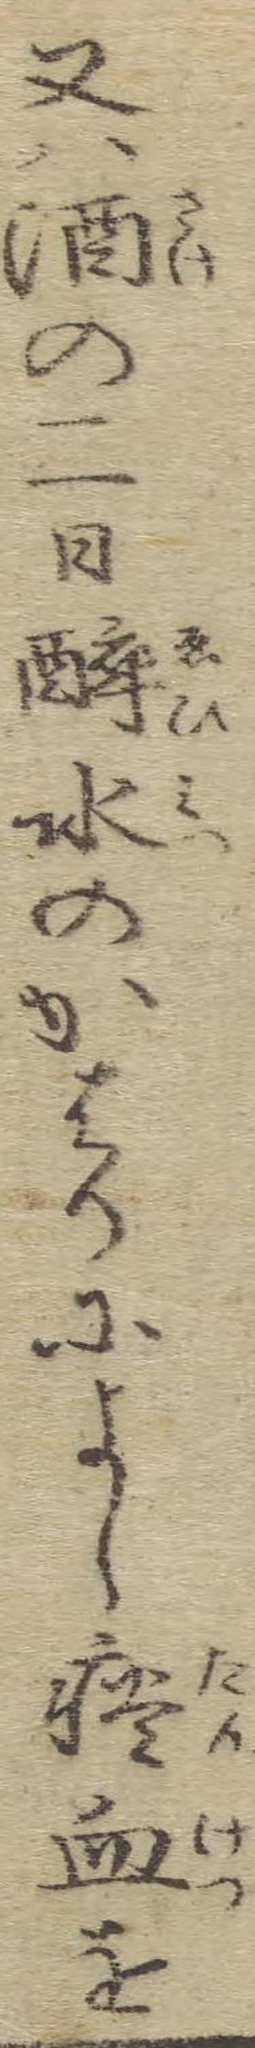又は酒の二日酔水のかはりによし痰血を
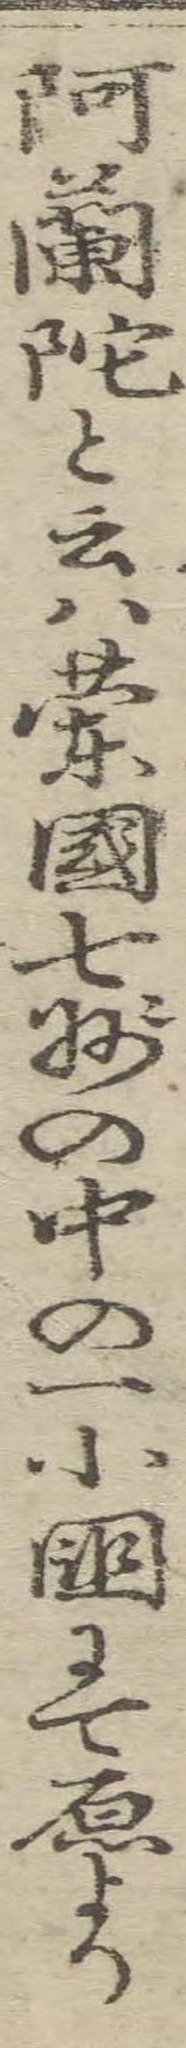阿蘭陀と云は蘭国七州の中の一小国にて原より
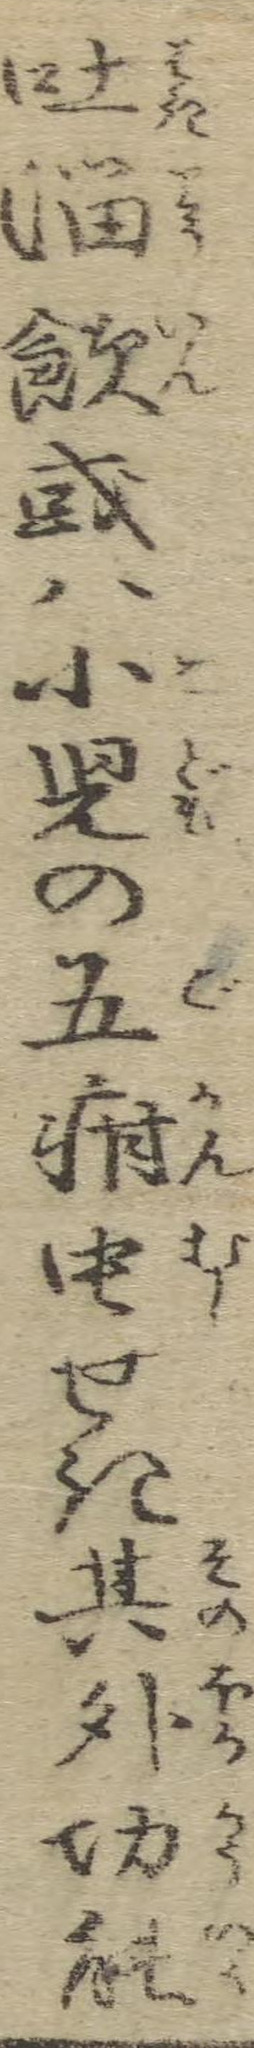吐溜飲或は小児の五疳虫せき其外功能
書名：浪華薬種問屋能書張交帖. 二
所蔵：国立国会図書館 National Diet Library, JAPAN
